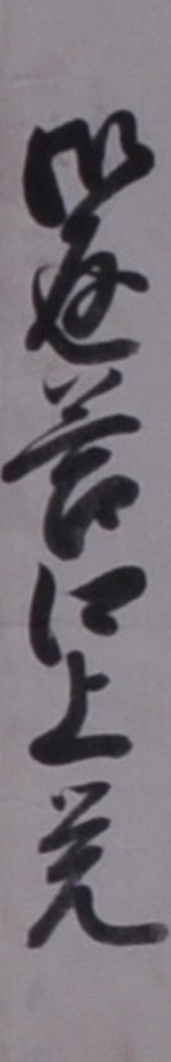御返答口上覚
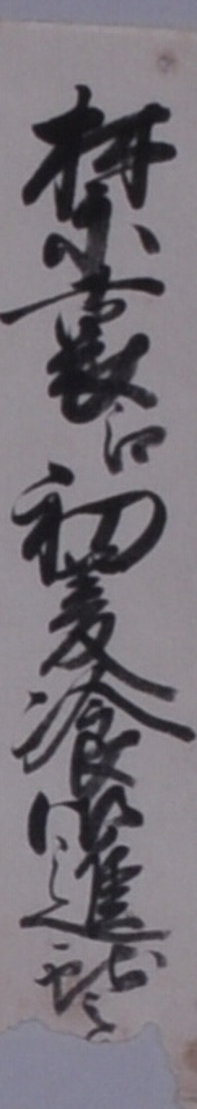禁裏え初菱喰御進献之
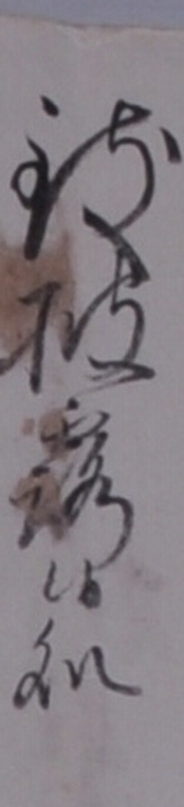致披露候処
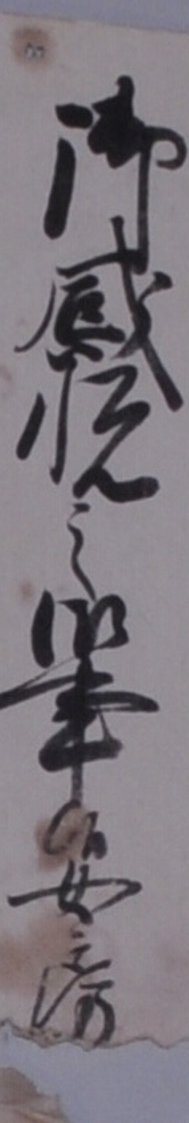御感悦之御事候女房
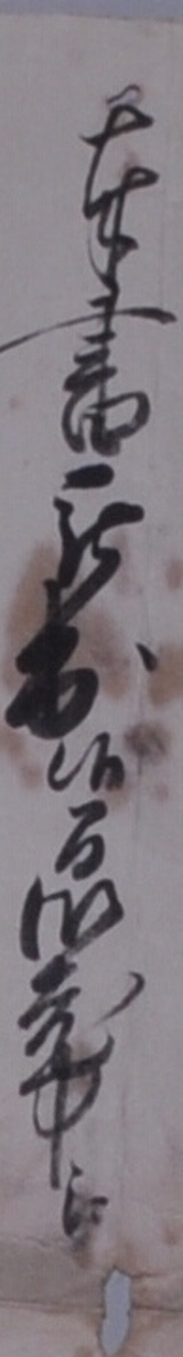奉書被出候間御老中え
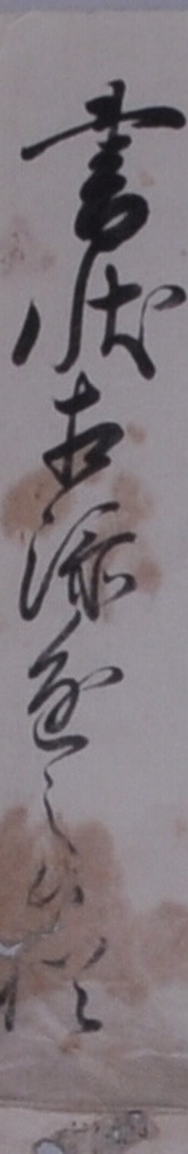書状相添進之候猶
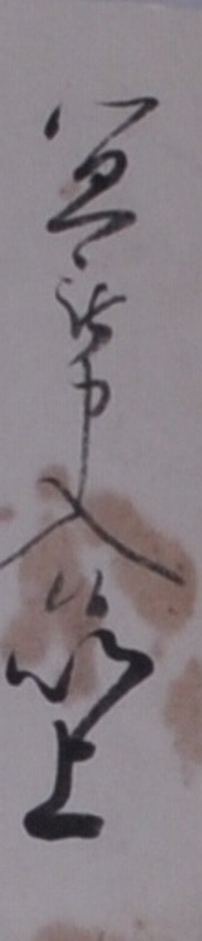宜被申入候以上
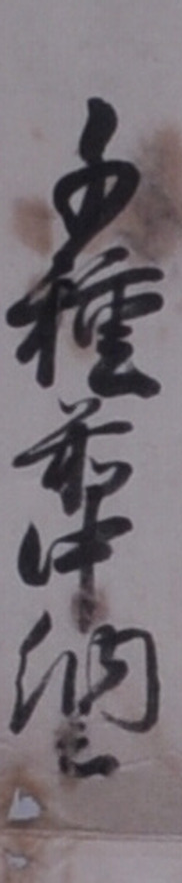千種前中納言
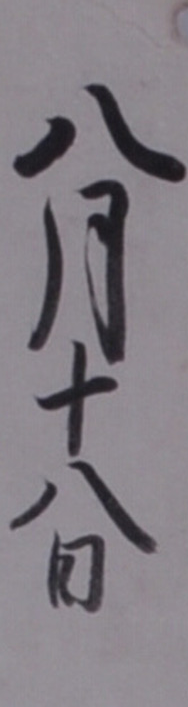八月十八日
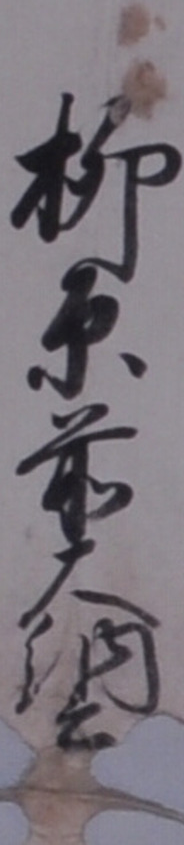柳原前大納言
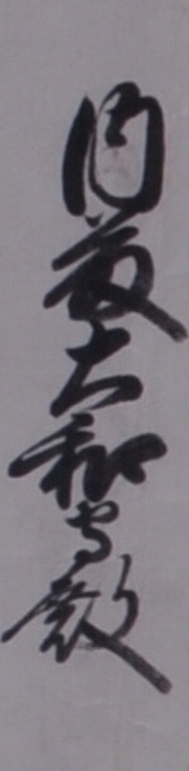内藤大和守殿
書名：御返答口上覚
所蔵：伊那市立高遠町図書館・合同会社AMANE
